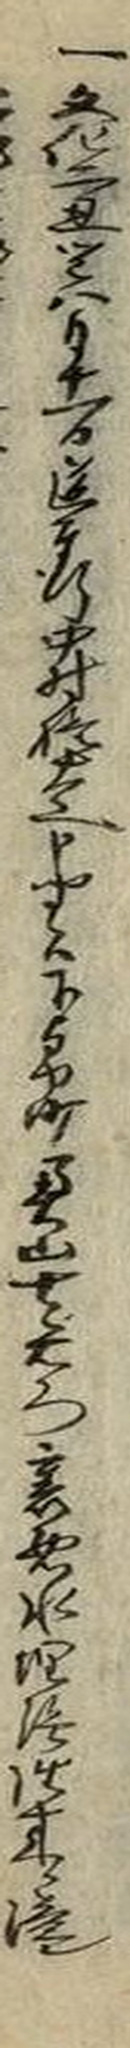一文化二丑閏八月十一日道奉行中村権大夫申聞候は下与力町奧山七郎右衛門裏悪水埋強往来へ溢レ
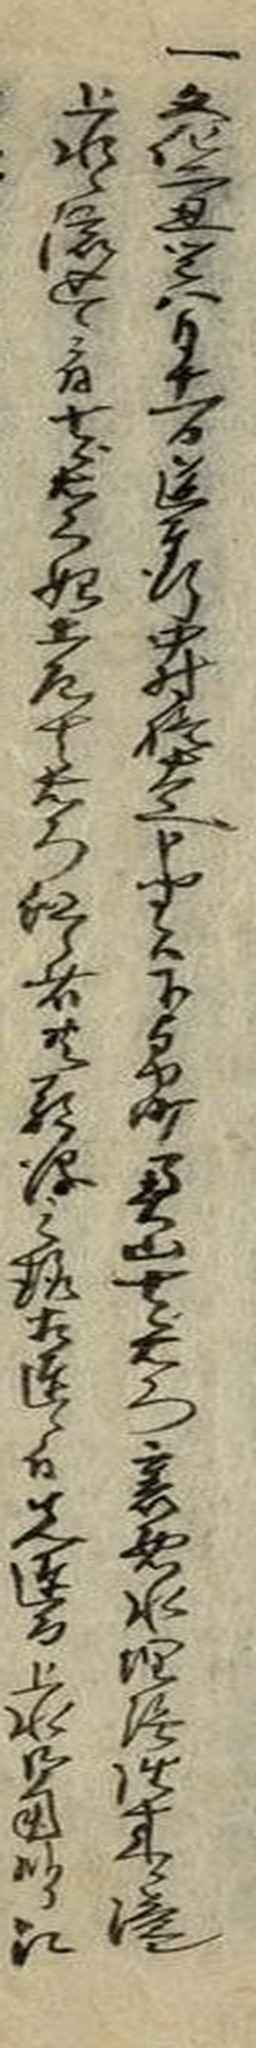上水へ流込候に付七郎右衛門始土屋十右衛門組之者共難儀之趣相達候に付先達て上水御用掛り江
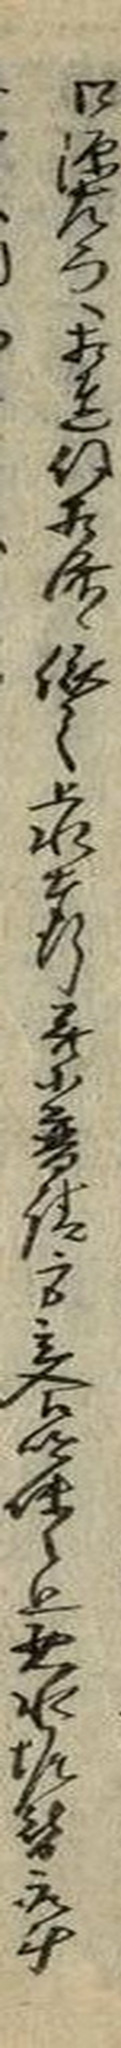口源左衛門へ相達伺相済候依之上水奉行并小普請方立合吟味之上悪水堀替取斗
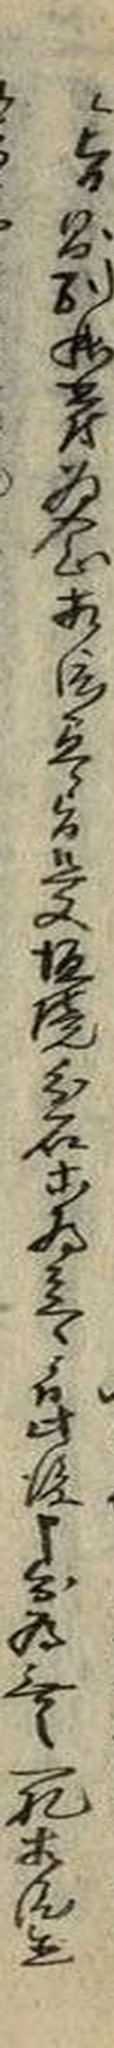候旨則別紙書付為念相渡置候旨且又垣境分石等為立候に付此後申分為無之一札相渡置
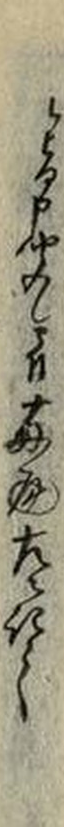候旨申聞候に付両通左に記之
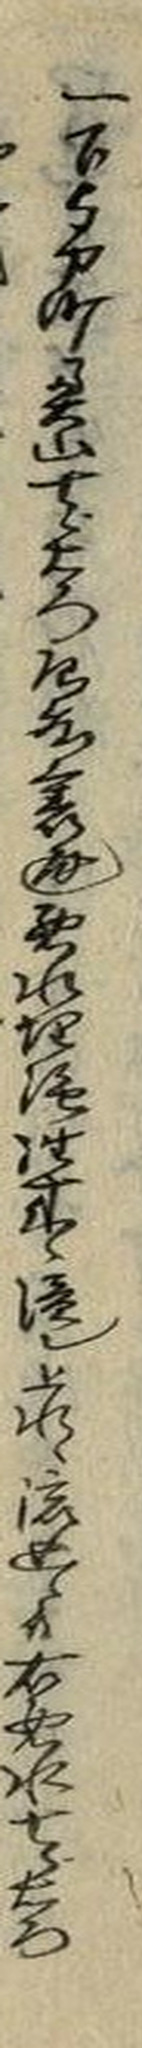一下与力町奧山七郎右衛門屋敷裏通悪水埋強往来へ溢レ上水へ流込候に付右悪水七郎右衛門
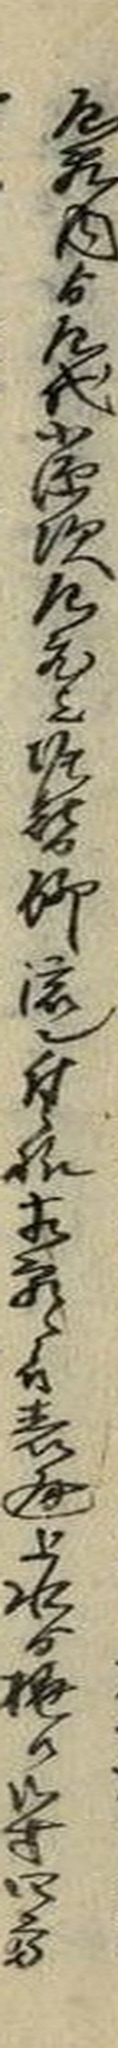屋敷内ゟ屋代小源次屋敷迄堀替聊流レ付候様相願候に付表通上水ゟ樋口弐寸四方
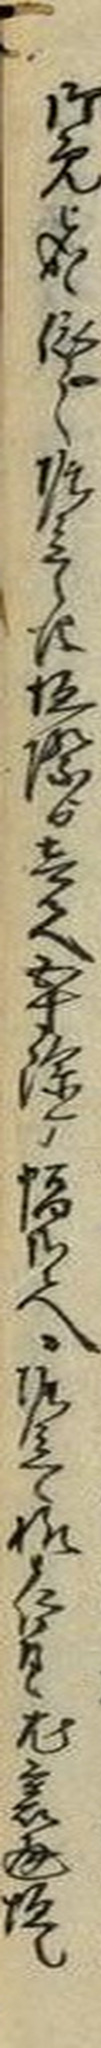御免被成候依之堀立之儀垣際ゟ壱尺五寸除ケ幅弐尺に堀立候様被仰付候尤裏通垣之
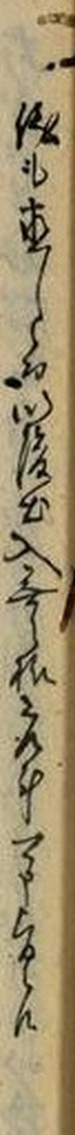儀も直し候て以後出入無之様取斗可申旨に候
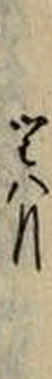閏八月
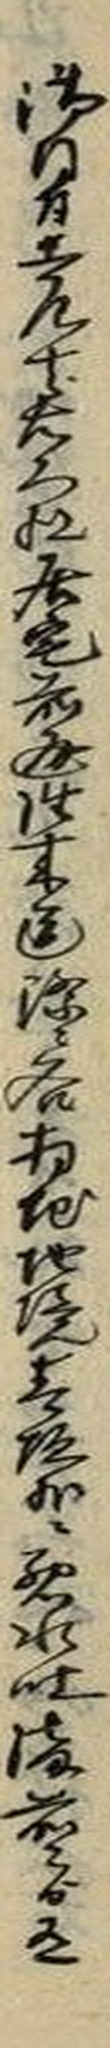御目付土屋十郎右衛門組居宅前通往来道際に各拝地地境青垣外に悪水吐溝前々ゟ有
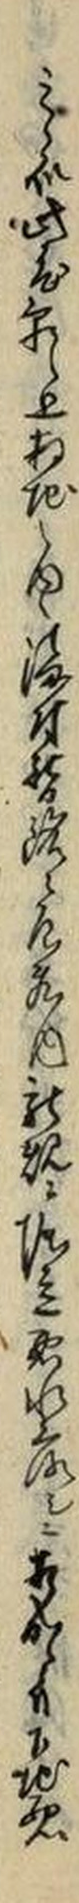之候処此度願之上拝地之内へ溝付替銘々屋敷内新規に堀立悪水落シに相成候に付下地悪
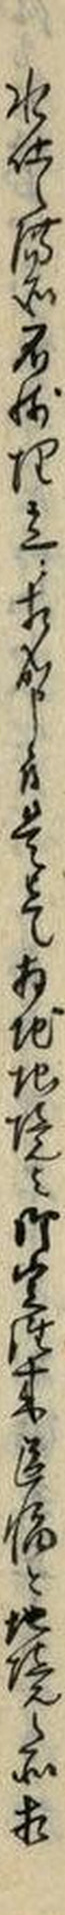水吐之場所不残埋立に相成申に付是迄之拝地地境と御定往来道幅と地境之所相
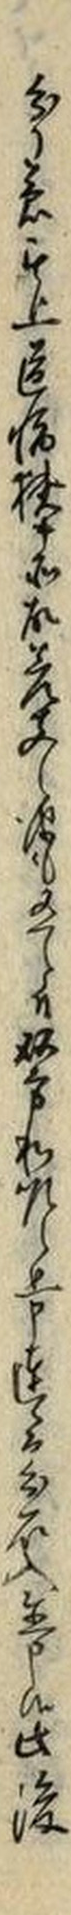分り兼其上道幅狭キ所故差支之儀も有之に付双方和順之上申達候て分石入置申候此後
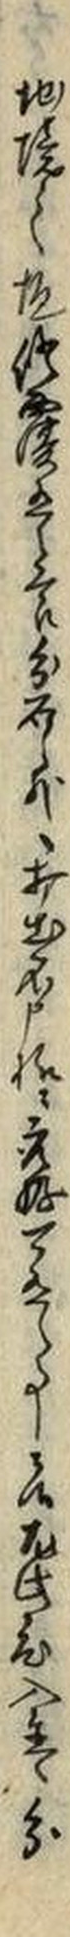地境之垣修覆有之節分石之外へ打出不申様に取扱可有之事に候尤此度入置候分
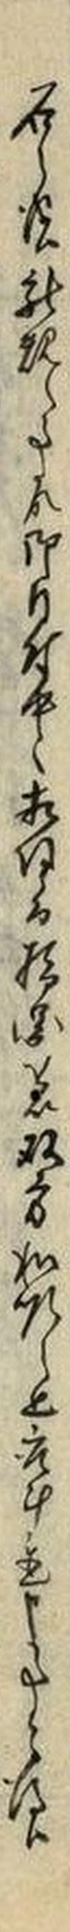石之儀は新規之事故御目付中へ相伺候て指図を以双方和順之上取斗置申事に候得は
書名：御城下諸事之部
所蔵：福井県文書館 Fukui Prefectural Archives
